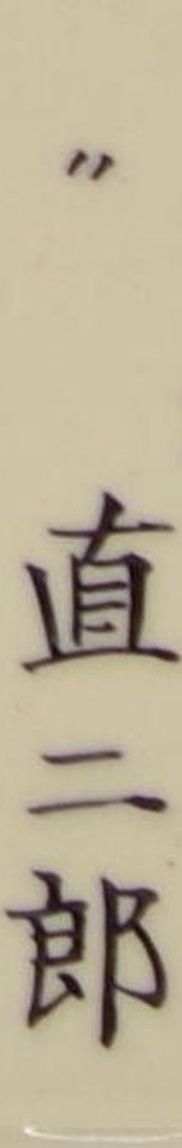直二郎
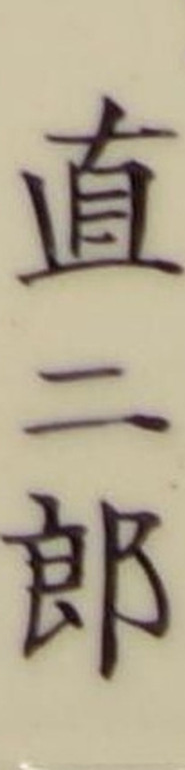直二郎
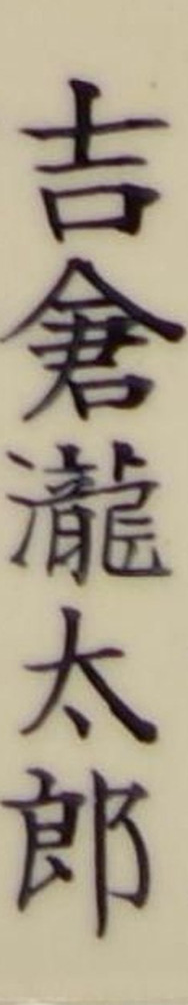吉倉瀧太郎
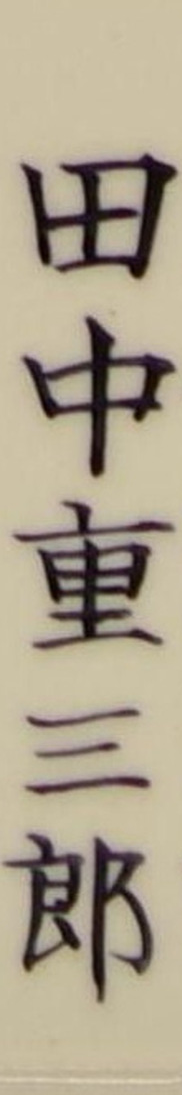田中重三郎
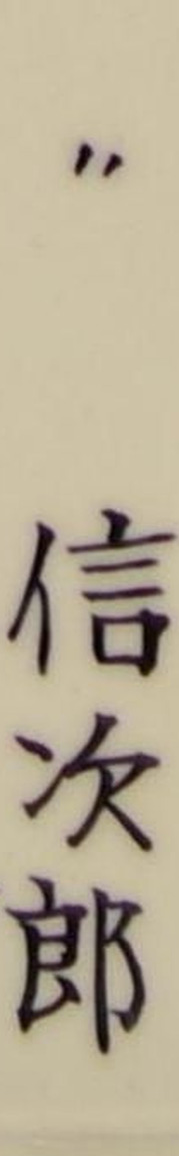信次郎
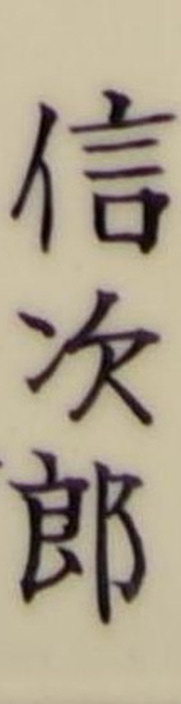信次郎
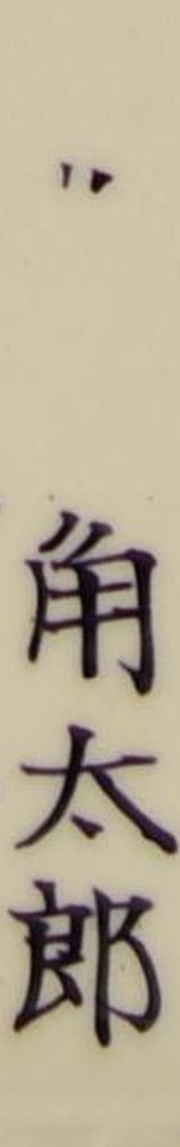角太郎
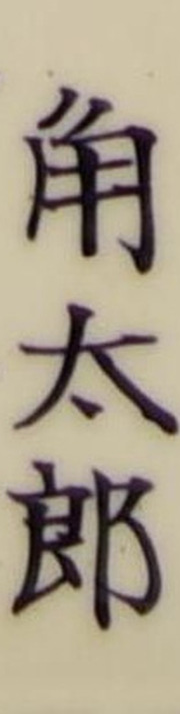角太郎
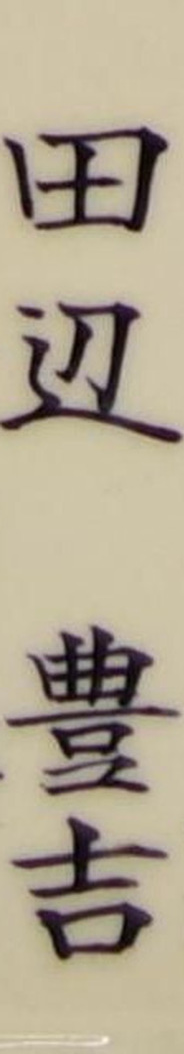田辺豊吉
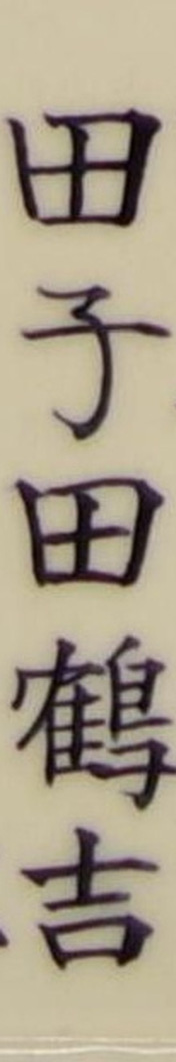田子田鶴吉
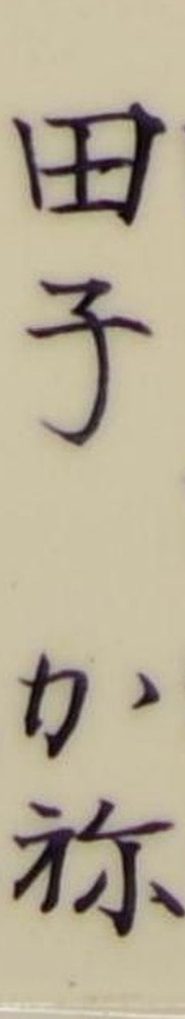田子かね
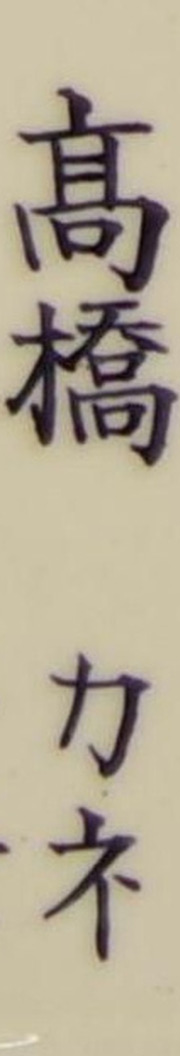高橋カネ
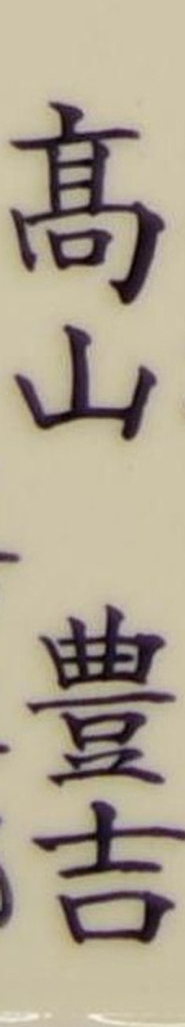高山豊吉
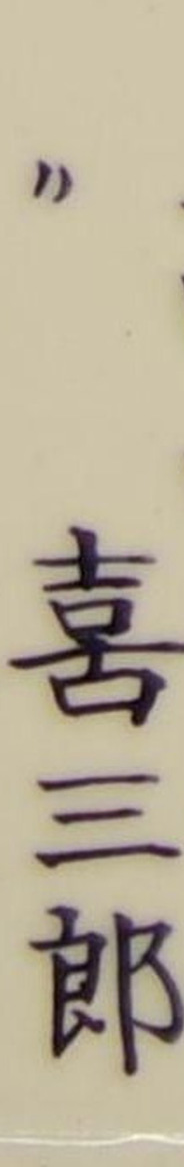喜三郎
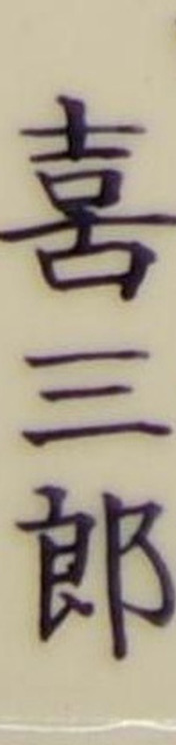喜三郎
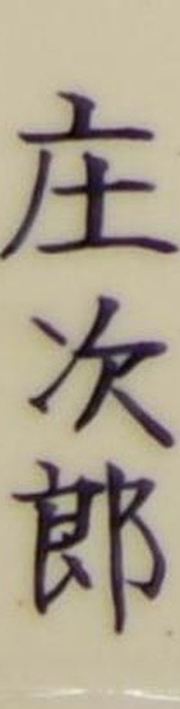庄次郎
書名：E~L
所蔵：高野山金剛峯寺
